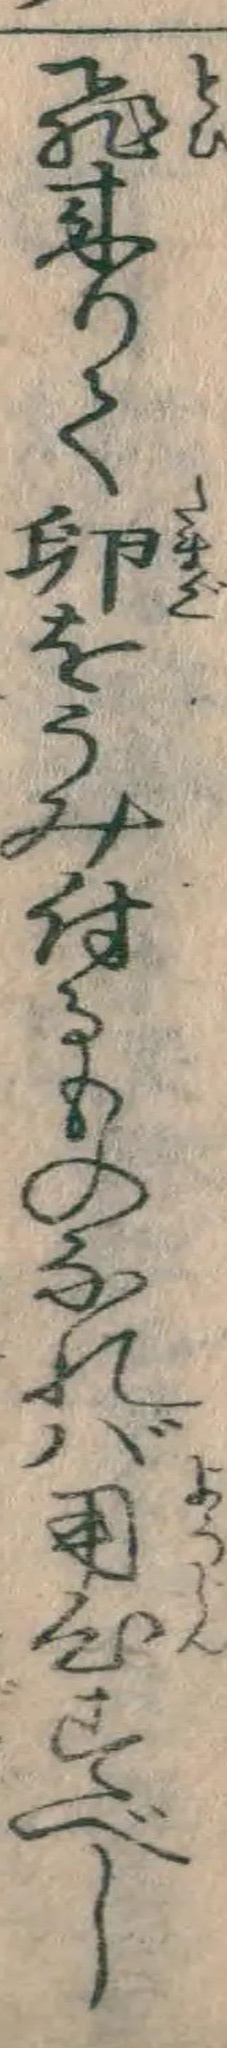飛来りて卵をうみ付るものなれば用心すべし
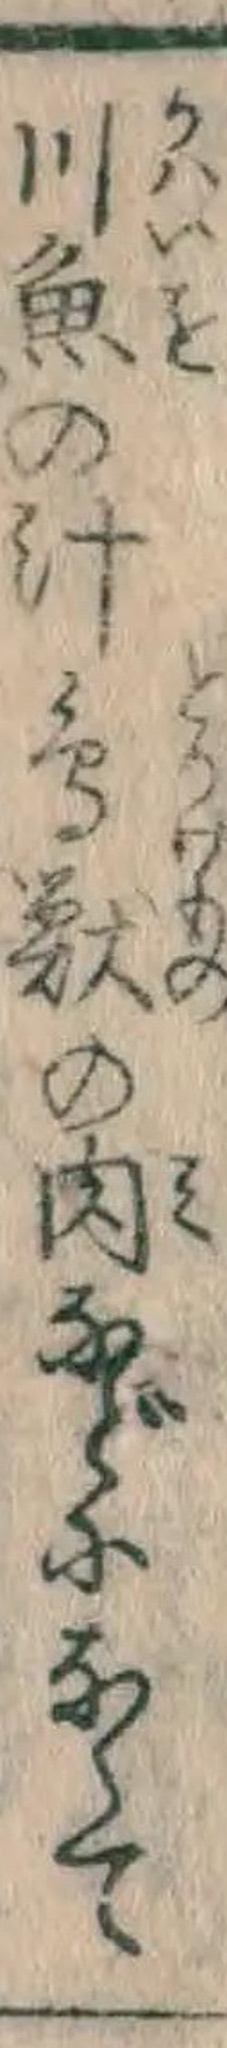川魚の汁鳥獣の肉などになくて
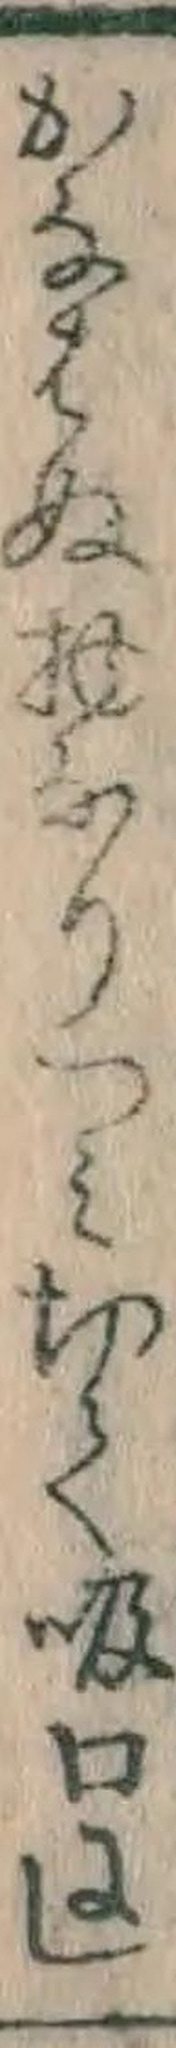かなはぬ物なりつみ切て吸口にし
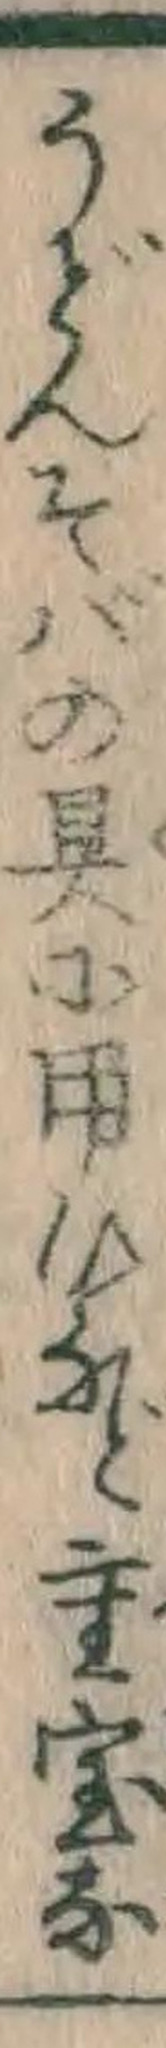うどんそばの具に用ひなど重宝な
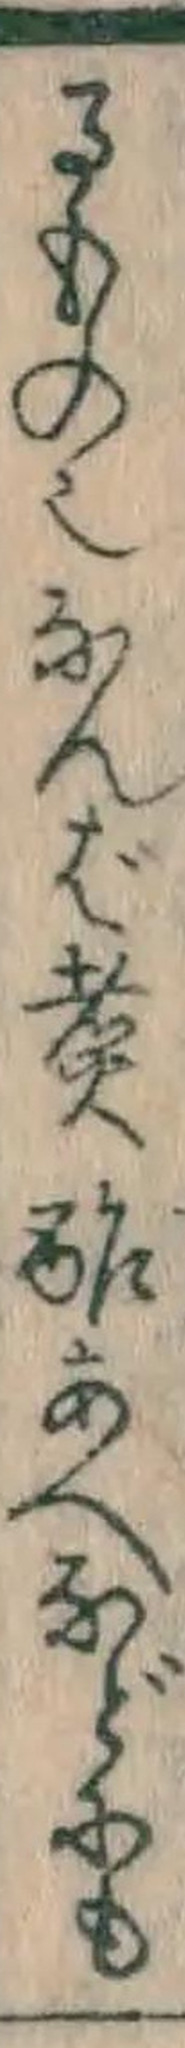るもの也なんば煮酢あへなどにも

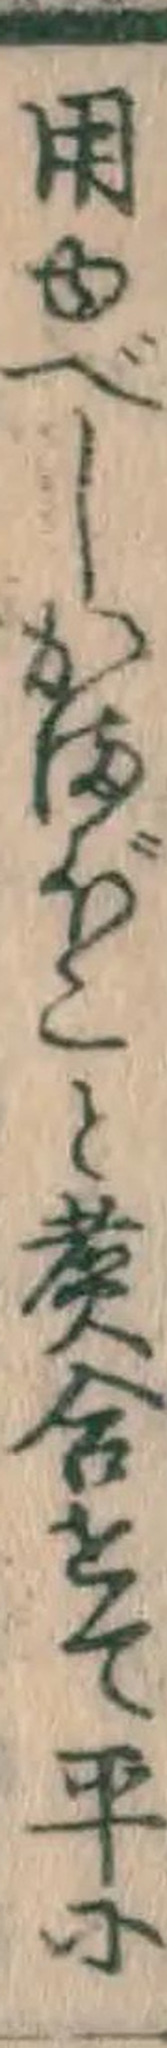用ゆべしかまぼこと煮合せて平に
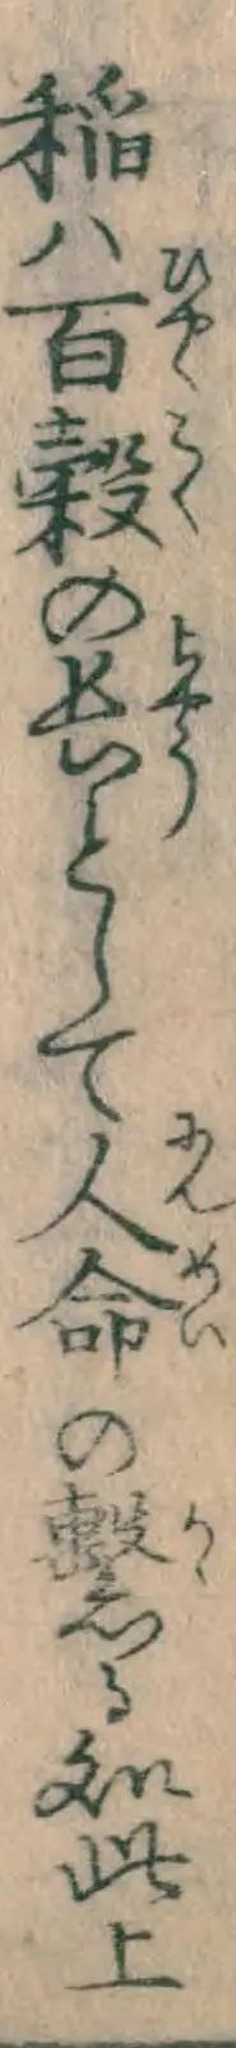一稲稲は百穀の長として人命の繋る処此上
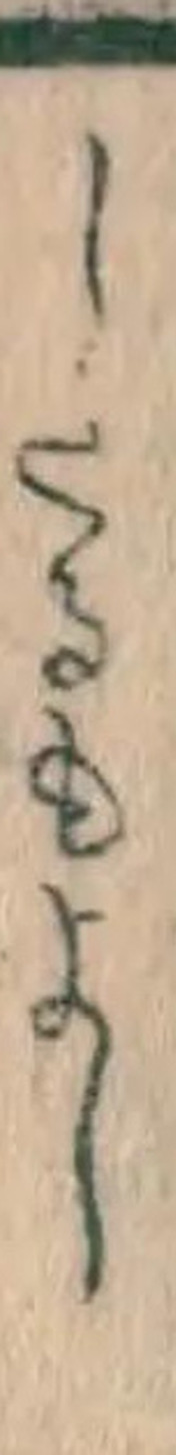したるもよし
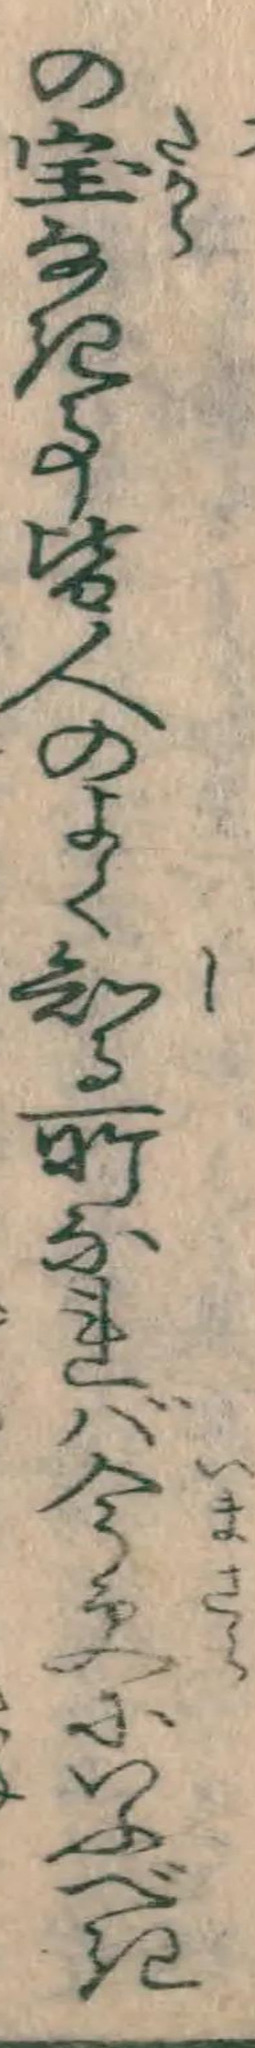の宝なき事皆人のよく知る所なれば今更にいふべき
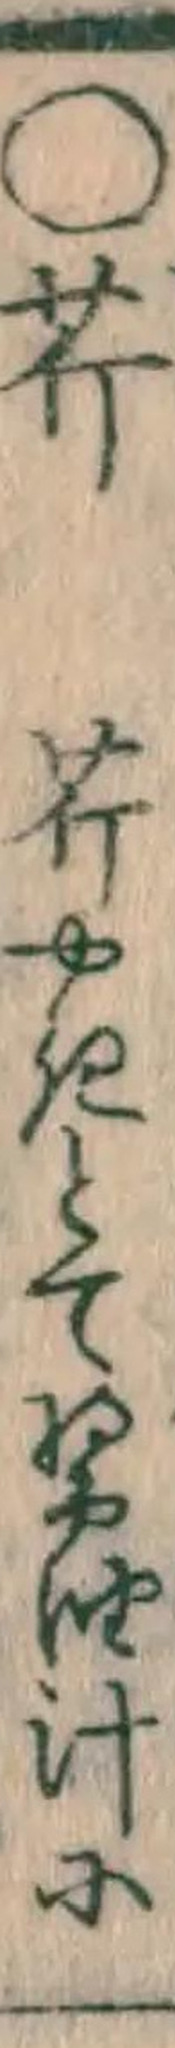○芹芹やきとて醬油汁に
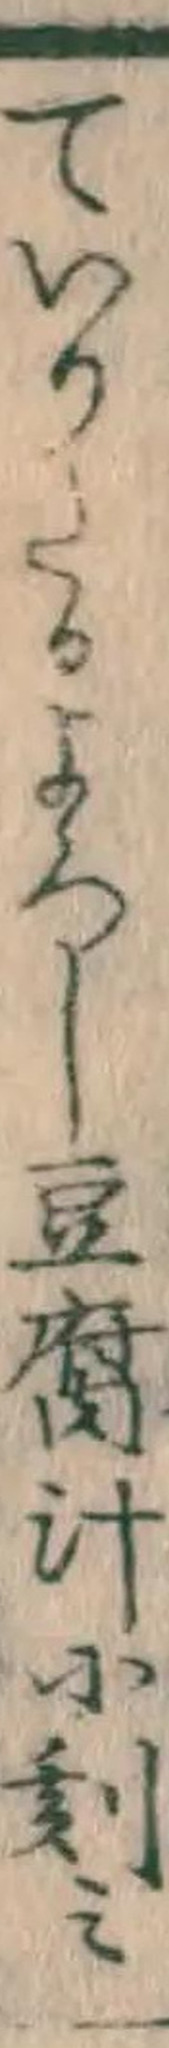ていりたるよろし豆腐汁に刻み
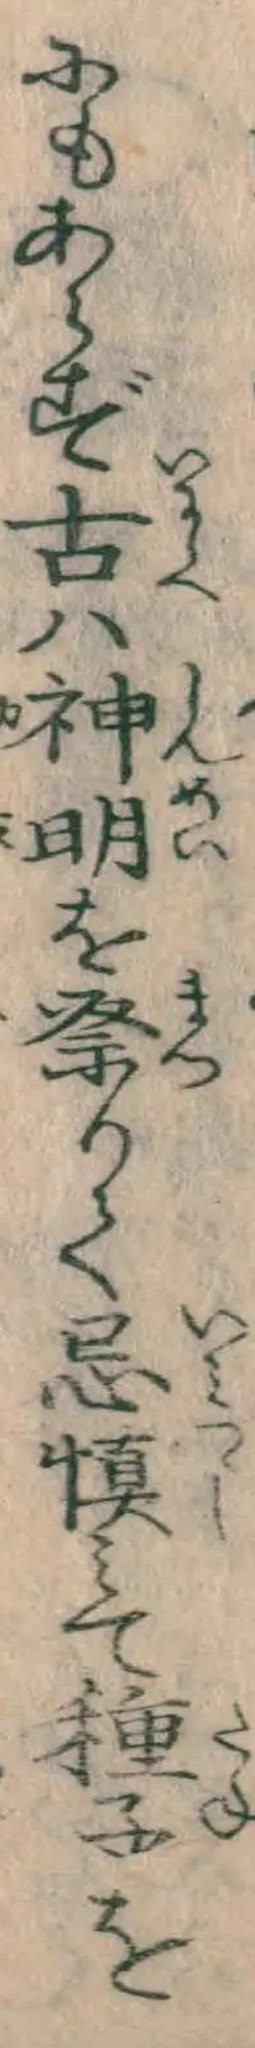にもあらず古は神明を祭りて忌慎みて種子を
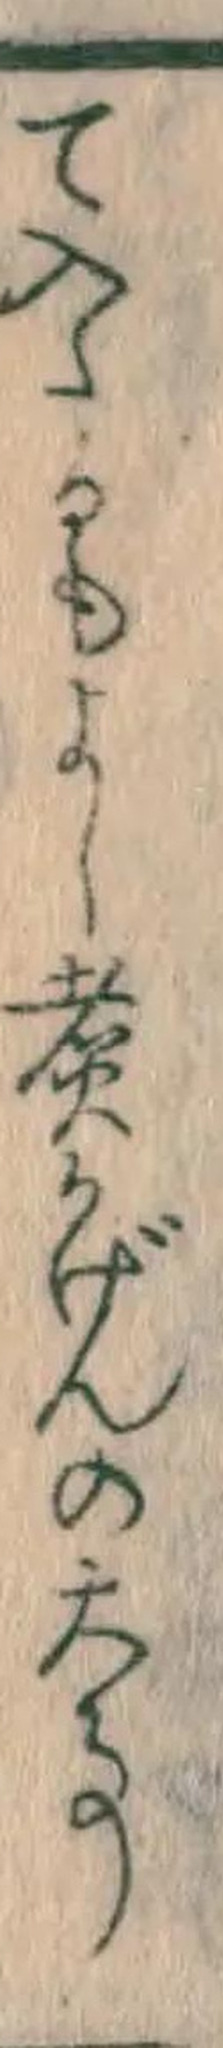て入たるもよし煮かげんの大事
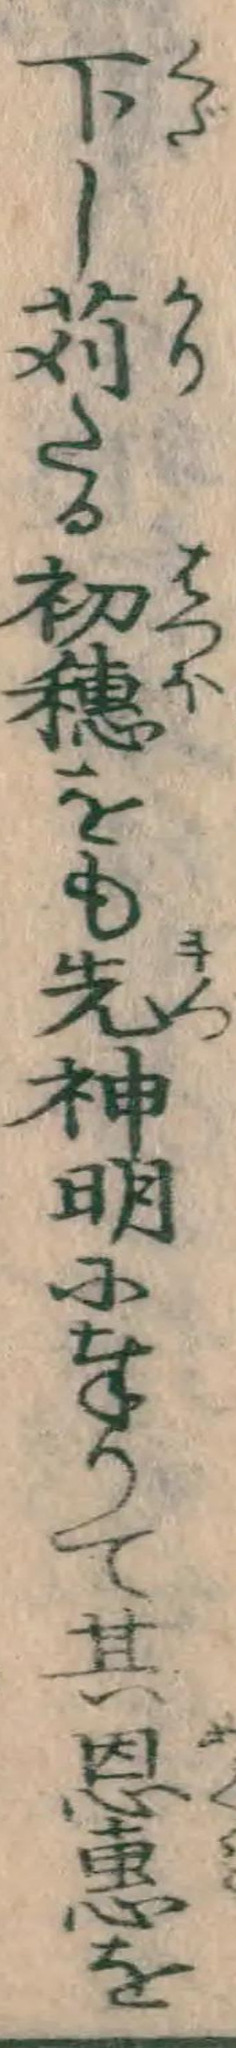下し苅たる初穂をも先神明に奉りて其恩恵を
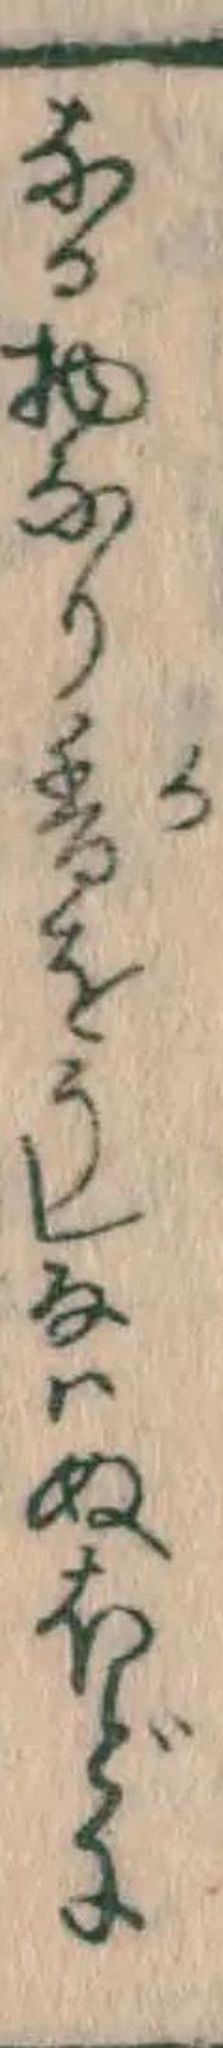なる物なり香をうしなはぬほどに
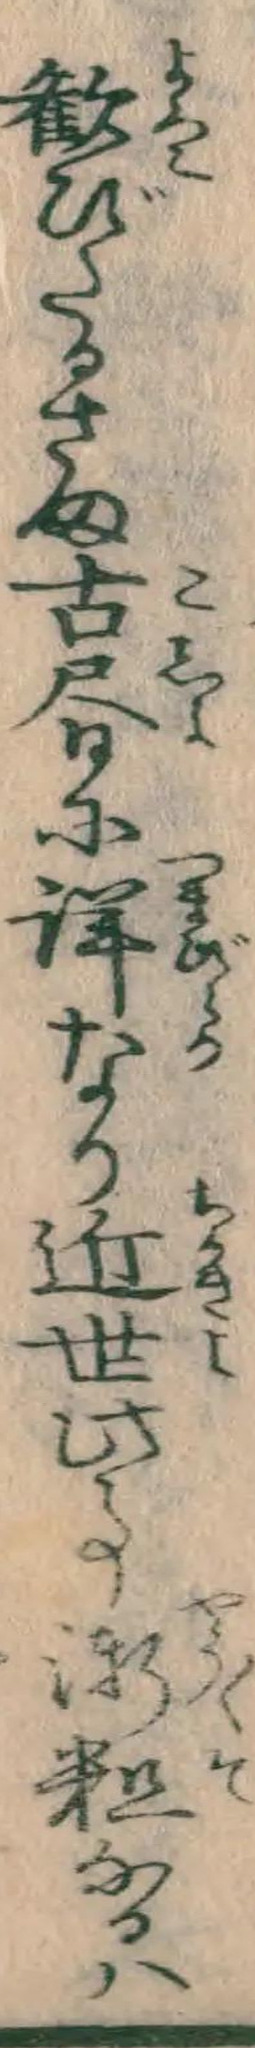歓びたるさま古書に詳なり近世此事漸粗なるは
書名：広益秘事大全 3巻. [5]
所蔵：国立国会図書館 National Diet Library, JAPAN
